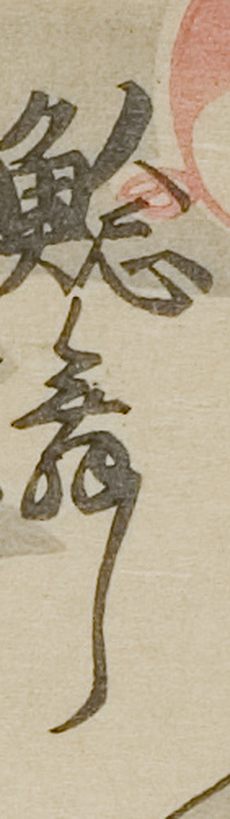鯰舞し
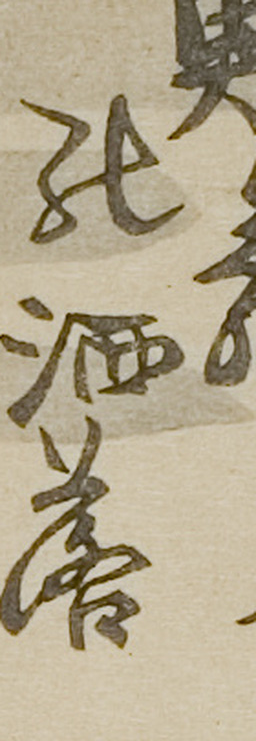の洒落
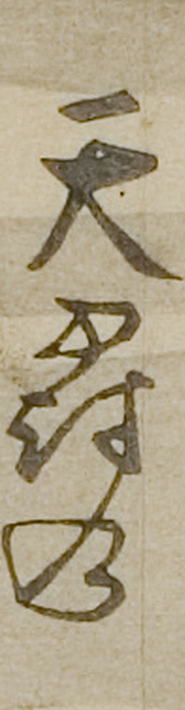天罰の
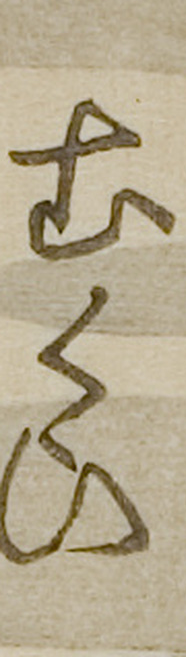むくひ
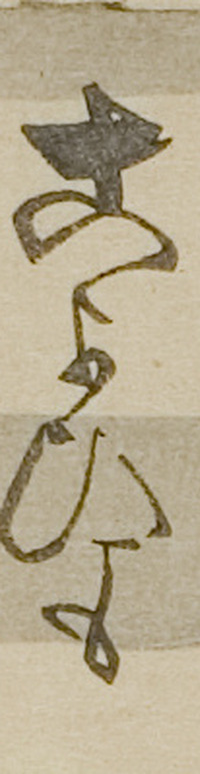こよひも
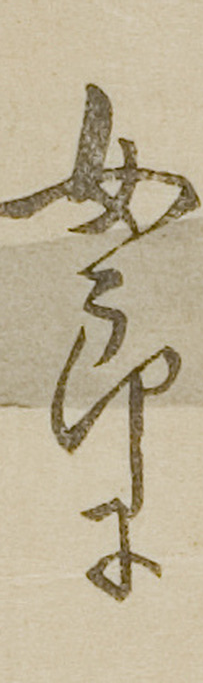女郎に
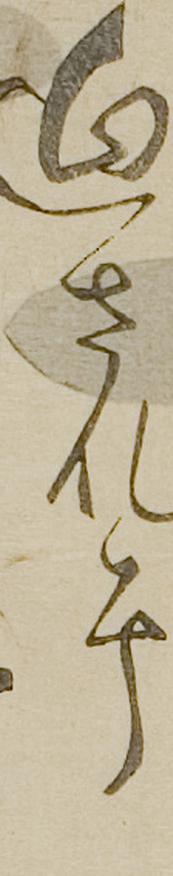廻されに
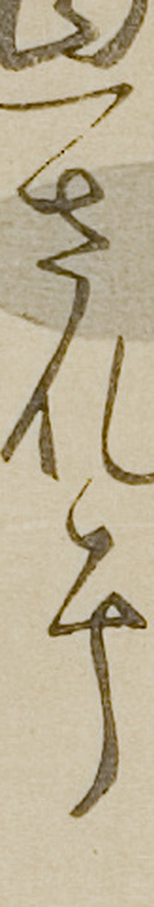廻されに
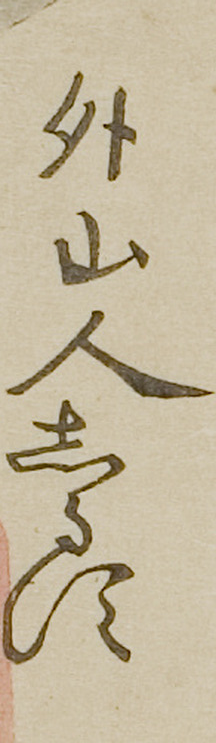外山人しるす
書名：鯰舞しの洒落
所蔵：東京大学総合図書館 General Library in the University of Tokyo, JAPAN
